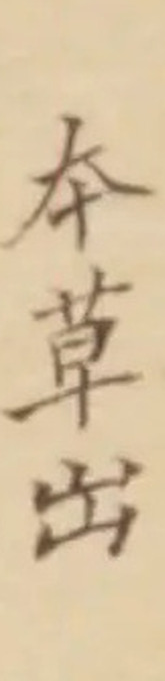本草出
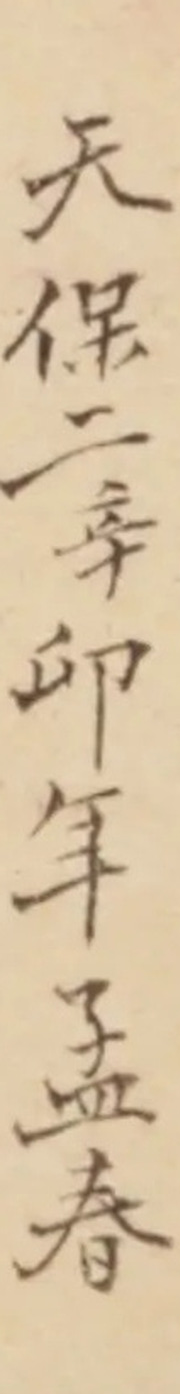天保二年辛卯年孟春
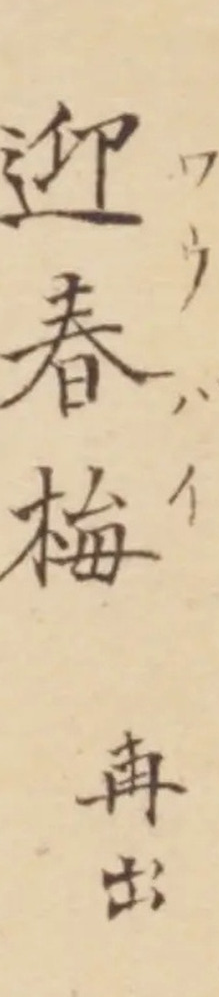迎春梅再出
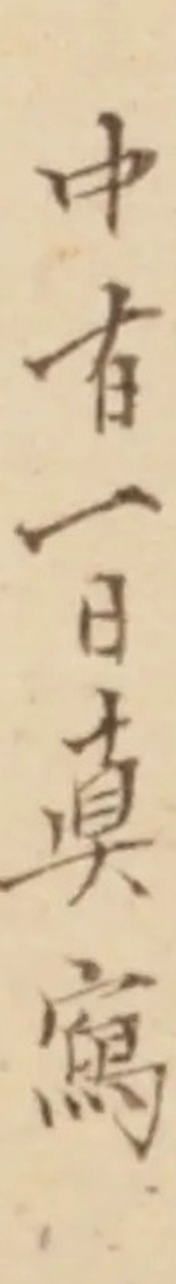中有一日真寫
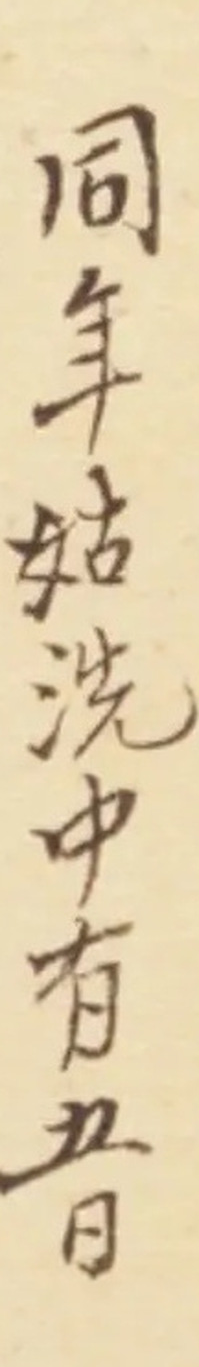同年姑洗中有五日
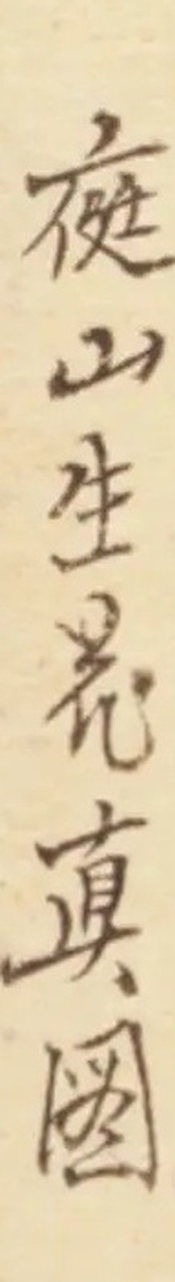庭山生花真寫
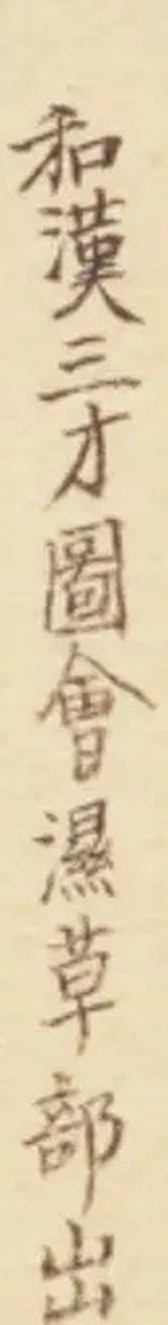和漢三才圖會濕草部出

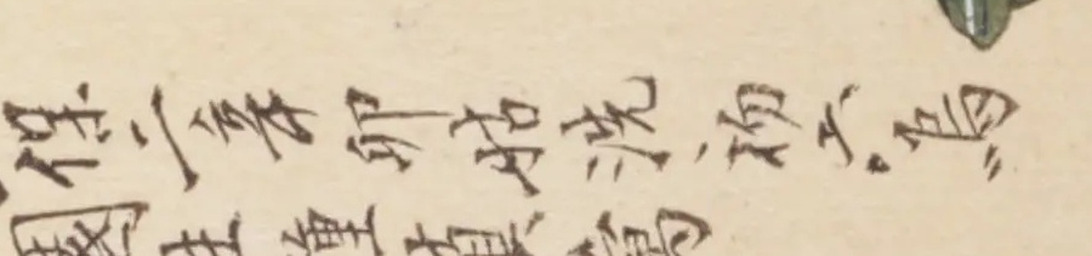天保二年卯年姑洗初六
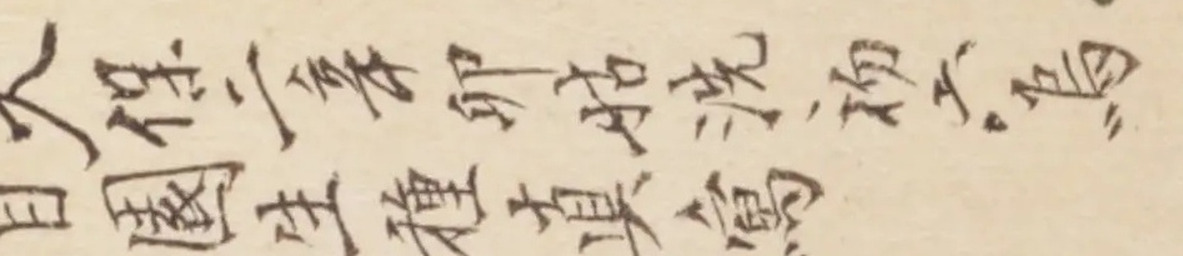天保二年卯年姑洗初六
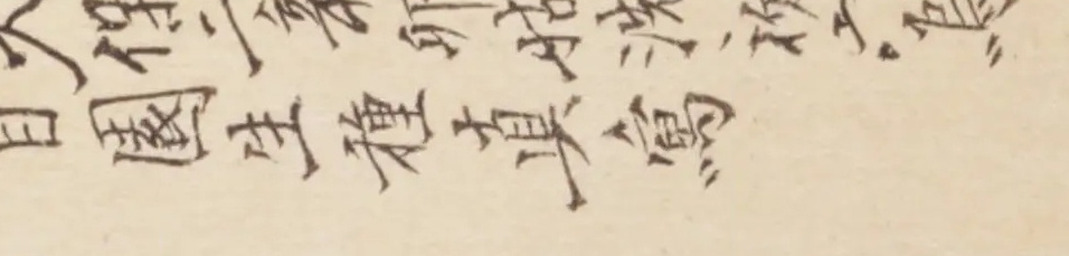自園生種真寫
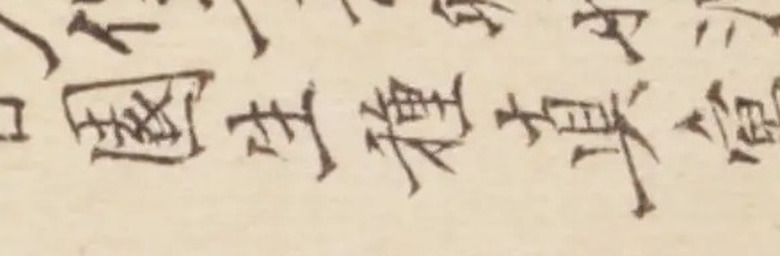自園生種真寫
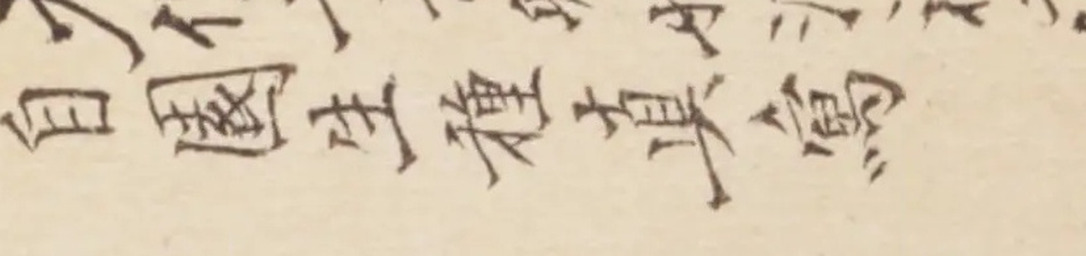自園生種真寫

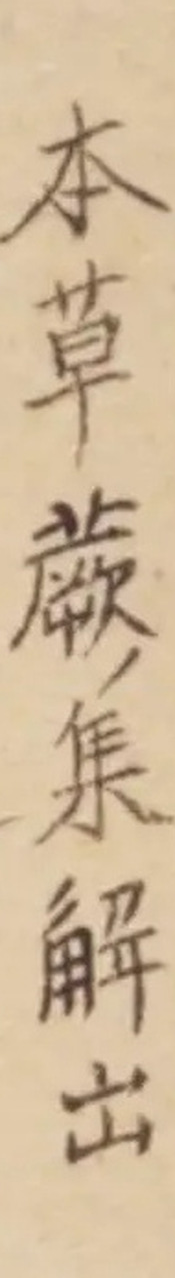本草蕨の集解出
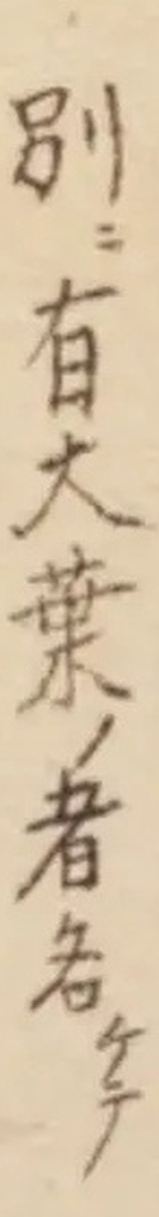別に有大葉の者名けて
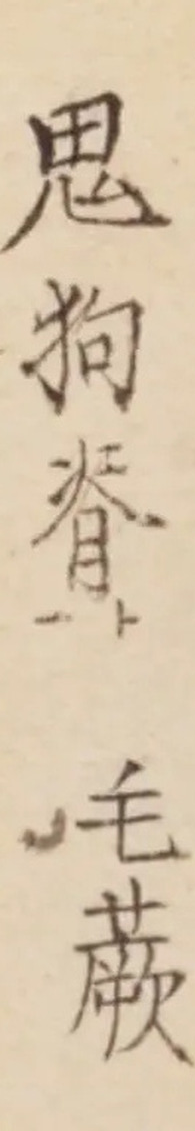鬼狗脊と毛蕨
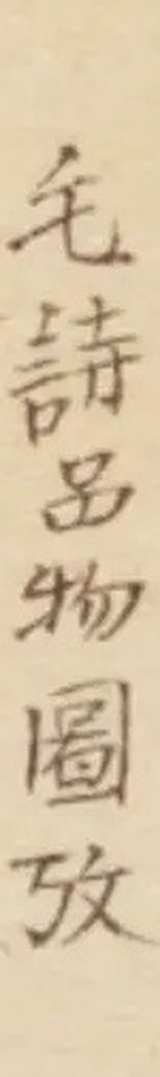毛詩品物圖攷
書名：梅園草木花譜春之部. 4
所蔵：国立国会図書館 National Diet Library, JAPAN
